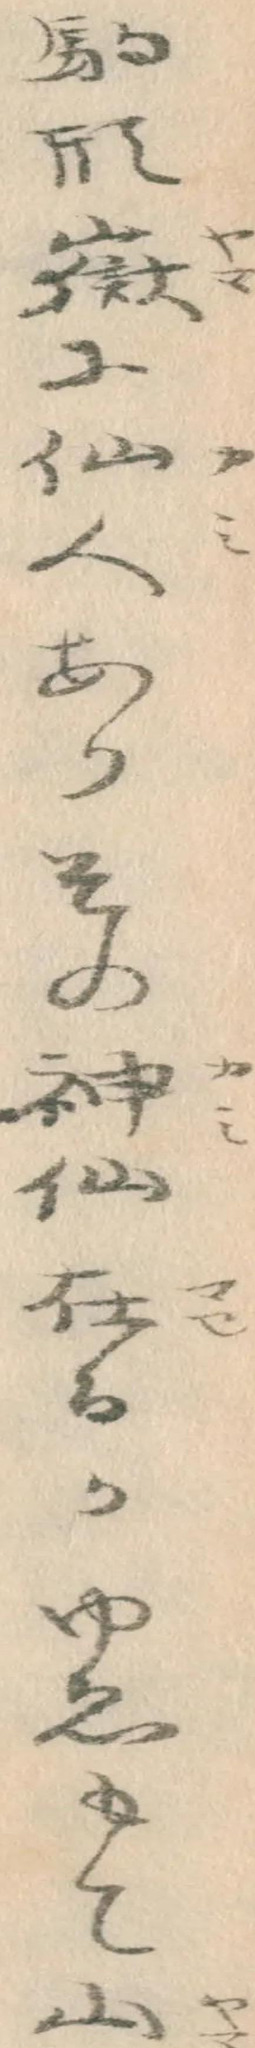駒形嶽に仙人ありその神仙在るかゆゑにて山
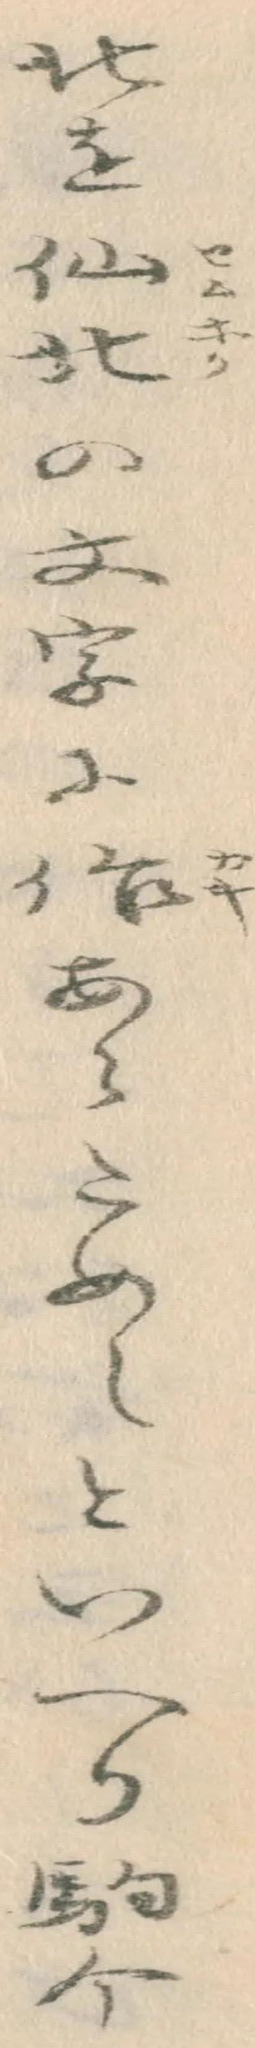北を仙北の文字に作あらためしといへり駒个
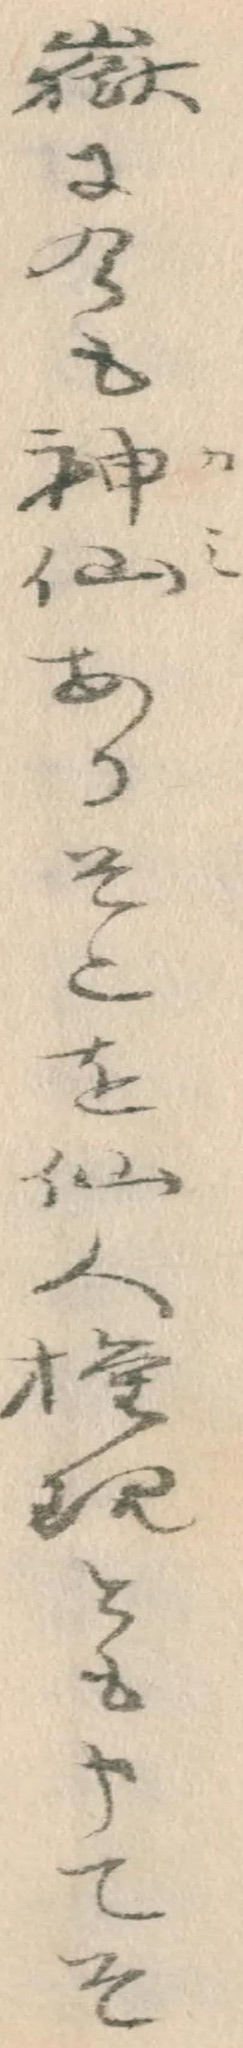嶽に今も神仙ありそこを仙人権現とも申てそ
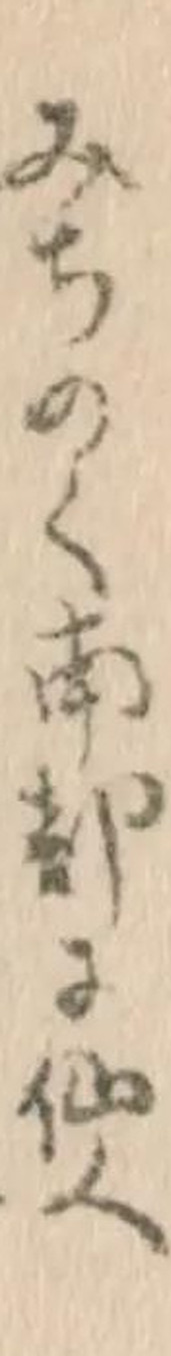みちのく南部に仙人
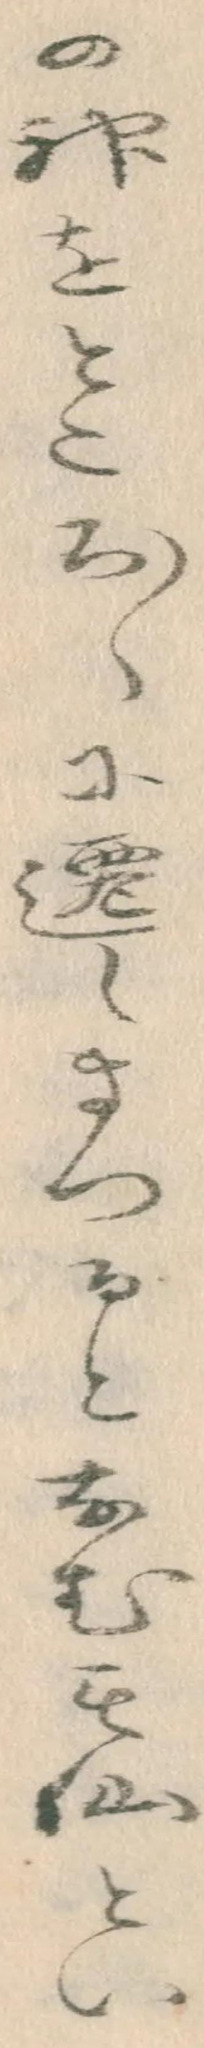の神をところ〳〵に遷しまつるとなむ其仙とい
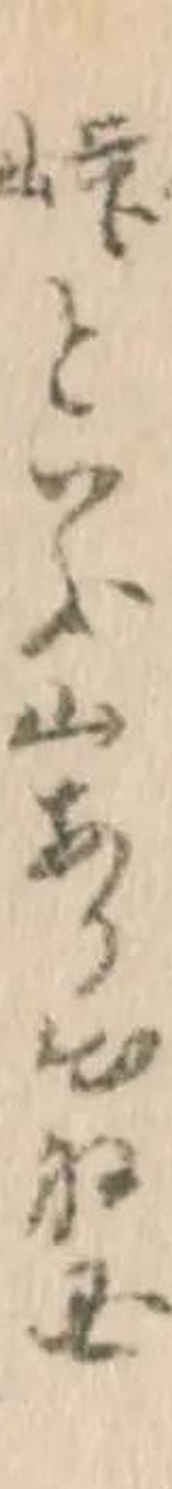峠といふ山ありで倭国
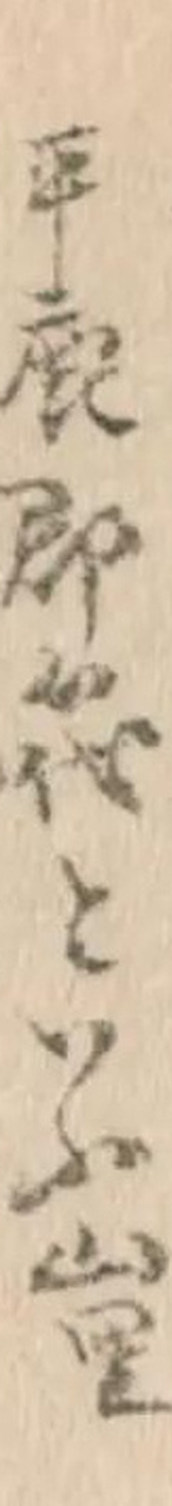平鹿郡筏といふ山里
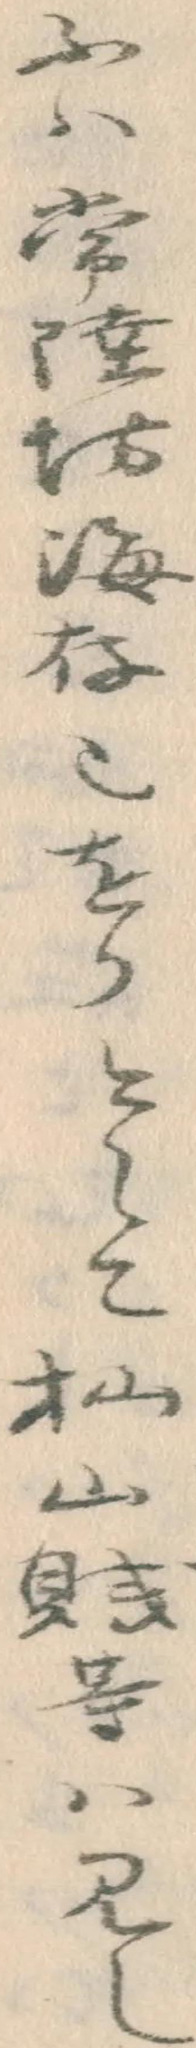ふは常陸坊海存也をりとして杣山賎䓁は見し
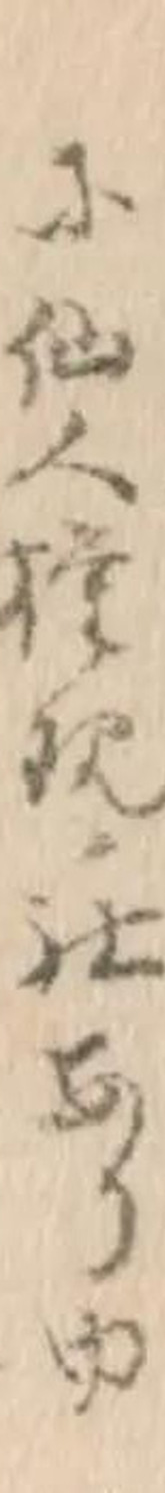に仙人権現社ありゆ
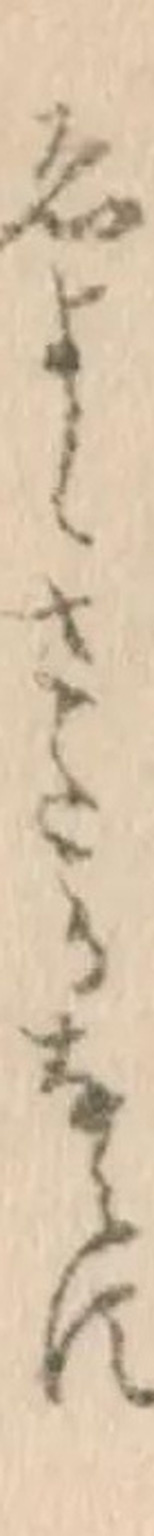ゑよしさたかならす
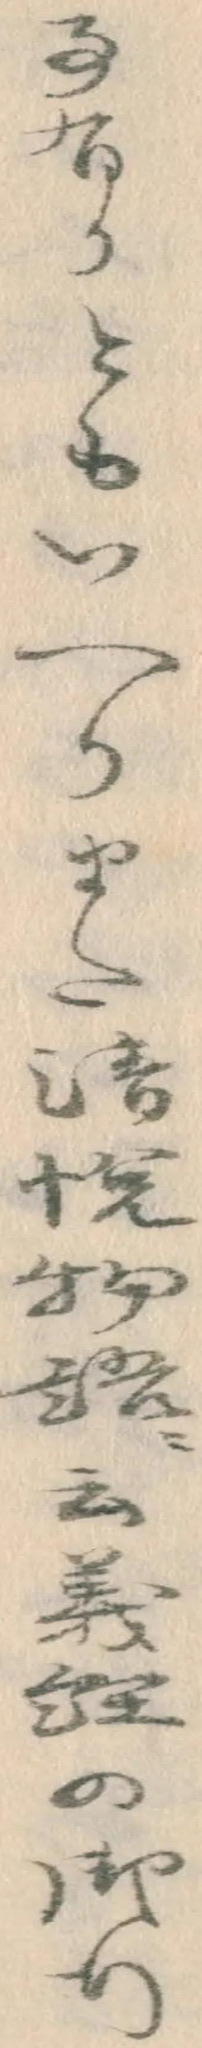事有りともいへりまた清悅物語云義經の御行
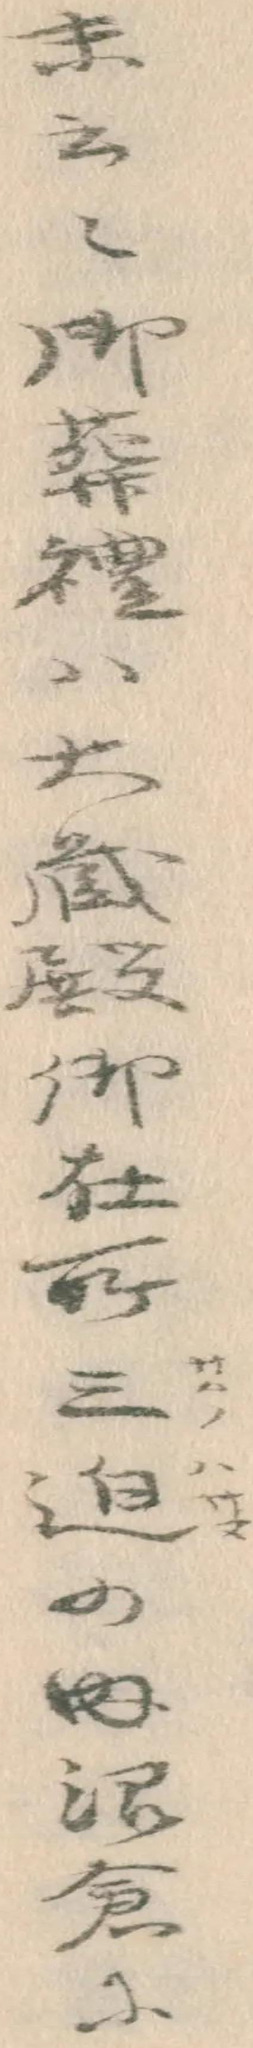末云々御葬禮は大蔵殿御在所三迫の内沼倉に
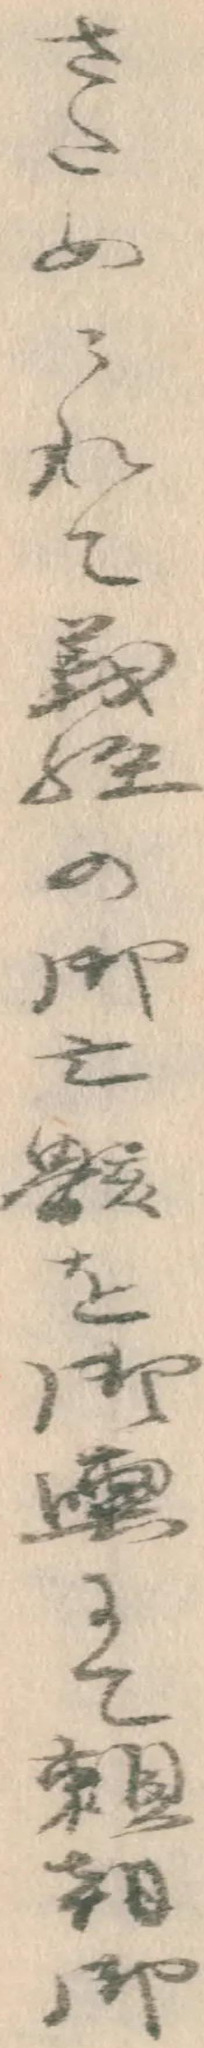さためられて義經の御亡骸を神輿にて頼朝御
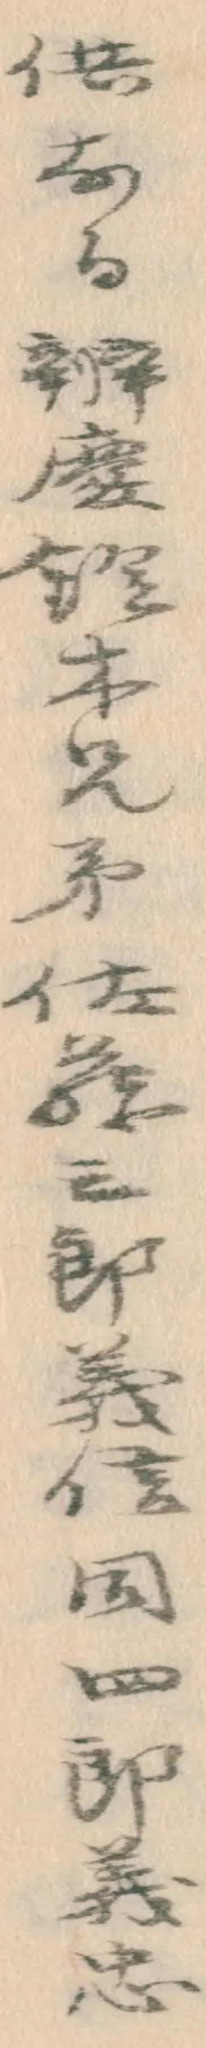供なる辨慶鈴木兄弟佐藤三郎義信同四郎義忠
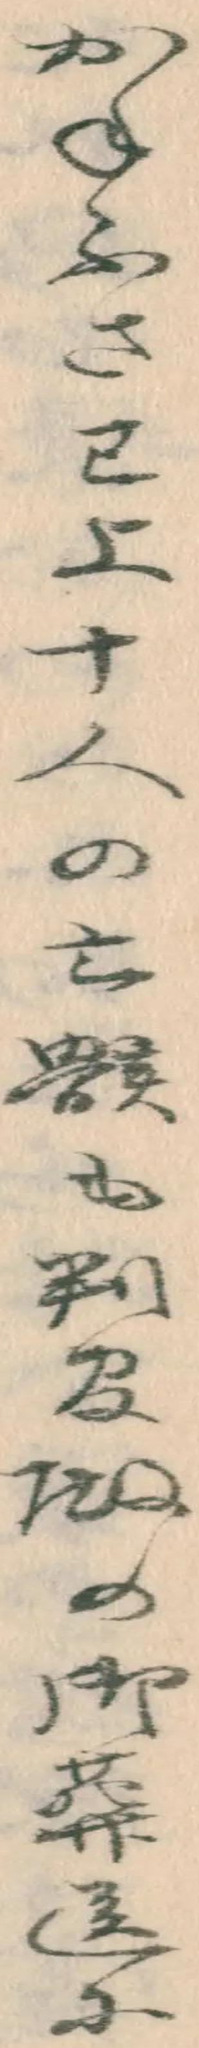かねふさ已上十人の亡骸も判官殿の御葬送に
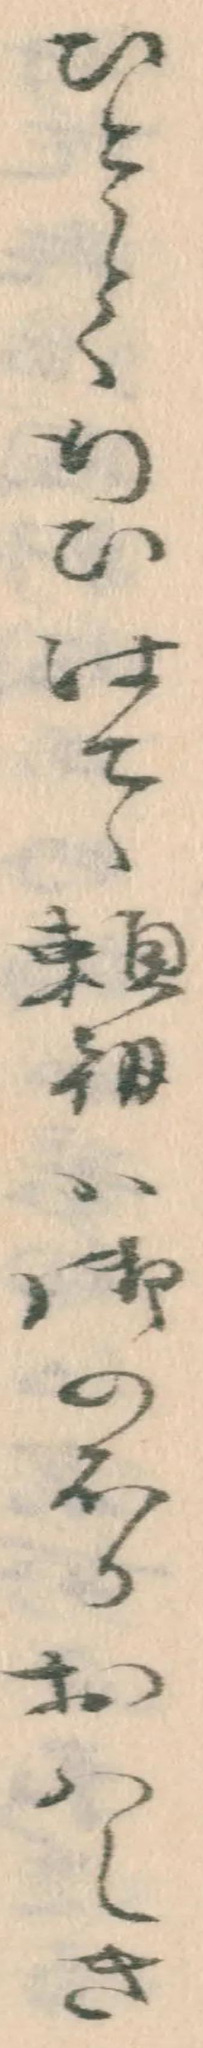ひとしく行ひはてゝ頼朝は御のほりおはしき
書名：眞澄遊覽記[第2冊]
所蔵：国立国会図書館 National Diet Library, JAPAN
